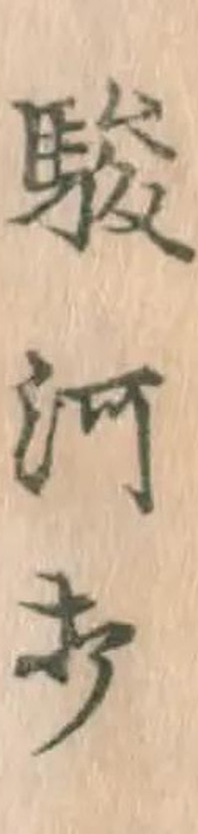駿河打
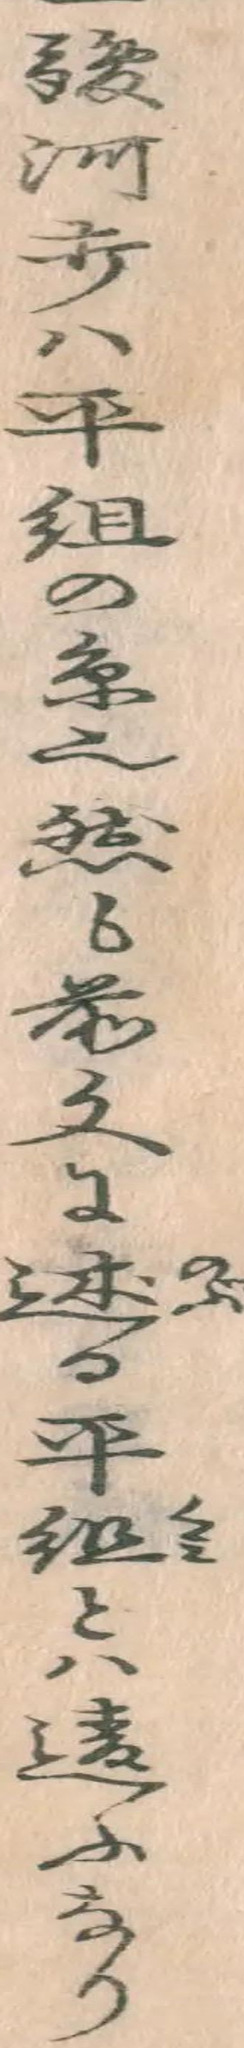一駿河打は平組の糸也然も前文に述る平組とは違ふなり
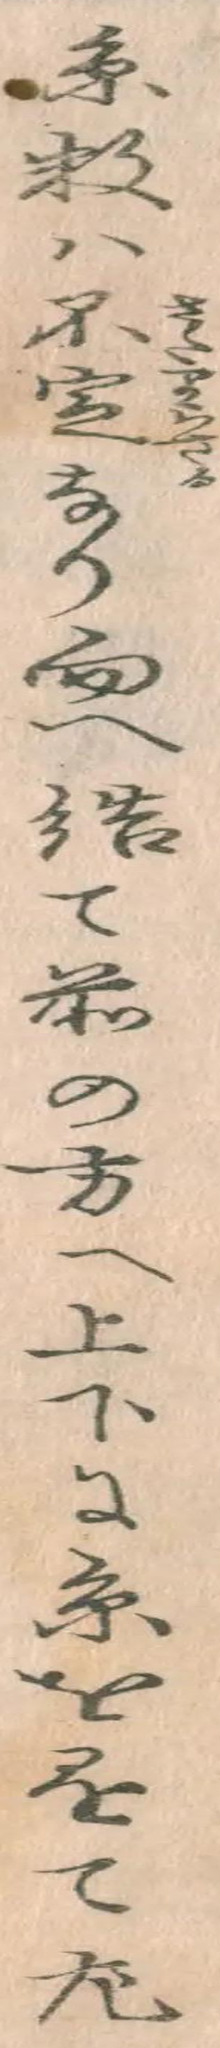糸数は不定なり向へ結て前の方へ上下に糸を懸て左
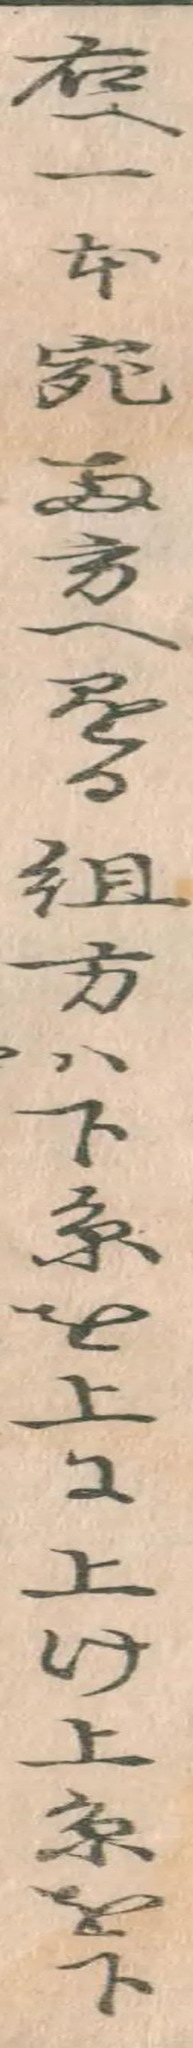右へ一本宛両方へ懸る組方は下糸を上に上け上糸を下
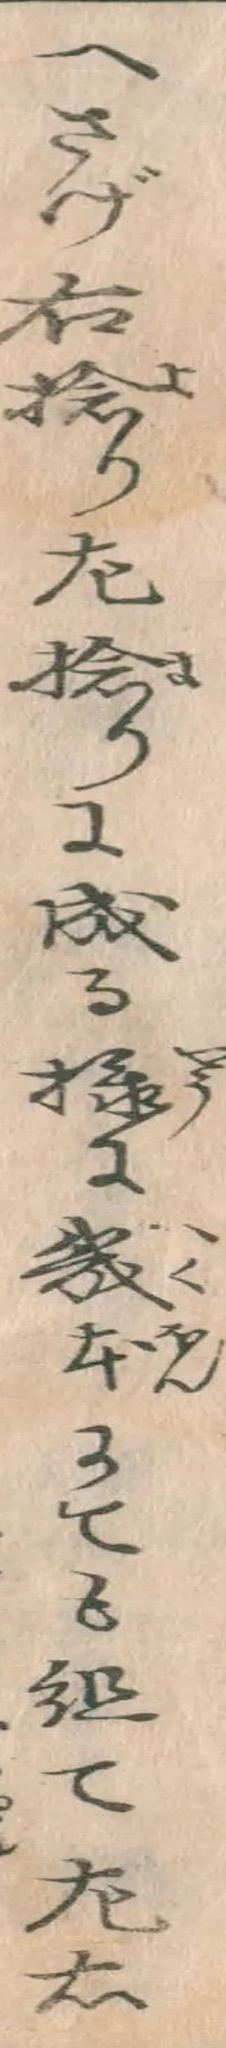へさげ右捻り左捻りに成る様に幾本にても組て左右
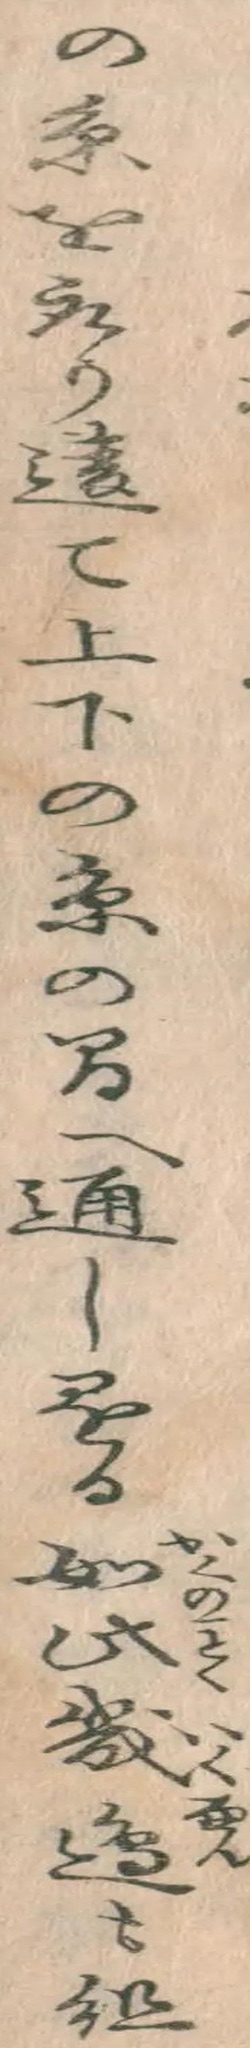の糸を取り違て上下の糸の間へ通し懸る如此幾辺も組

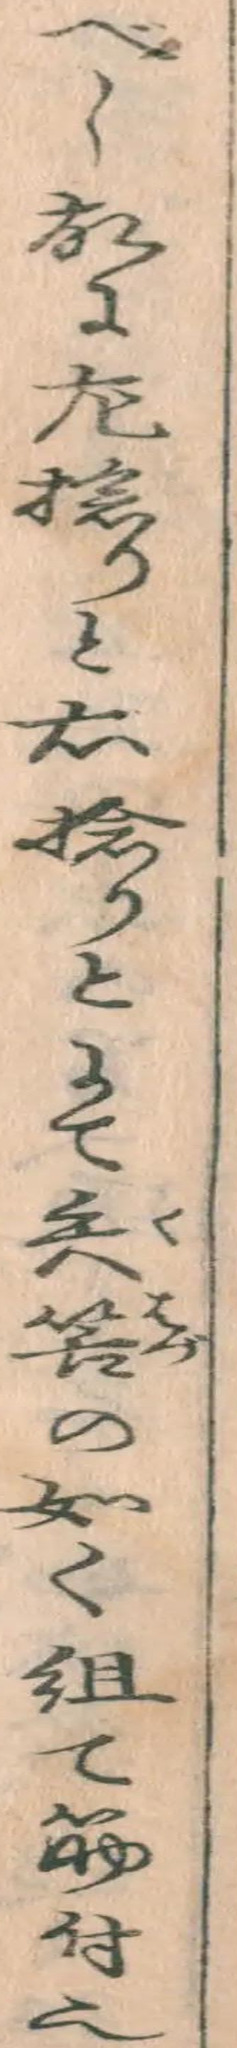べし故に左捻りと右捻りとにて矢筈の如く組て筋付也
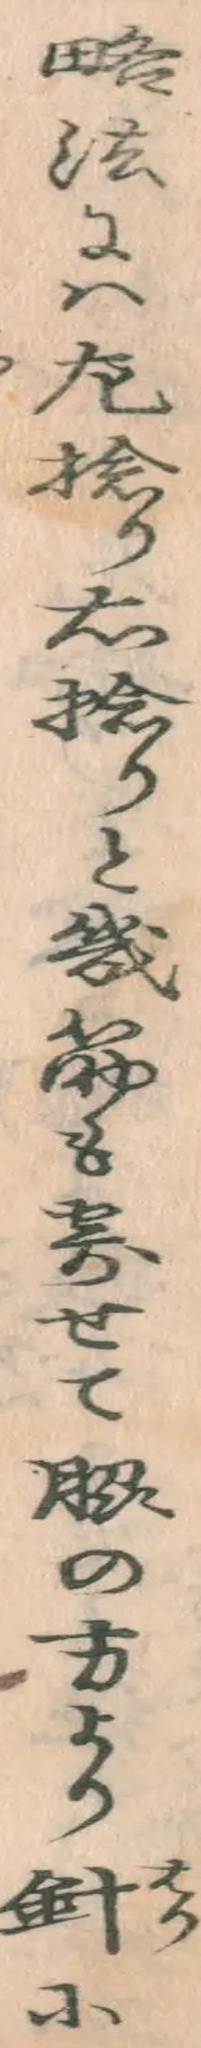略法には左捻り右捻りと幾筋も寄せて脇の方より針に
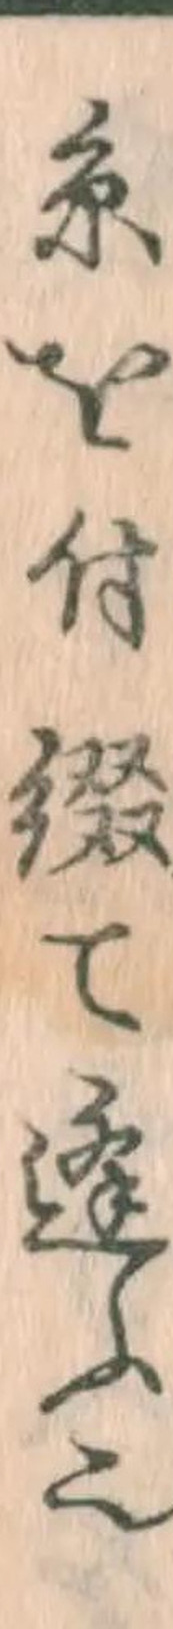糸を付綴て逢ふ也
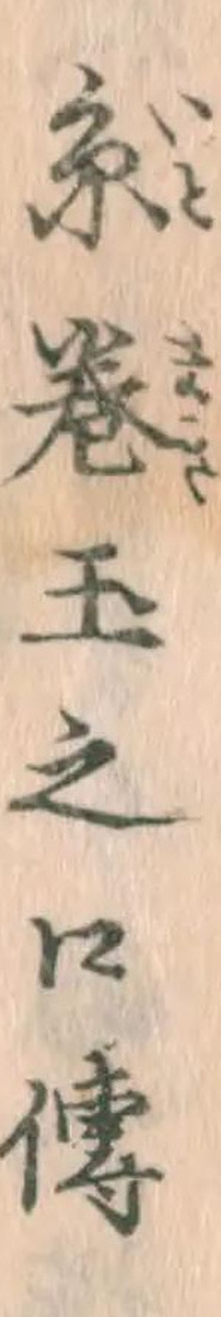糸巻玉之口伝
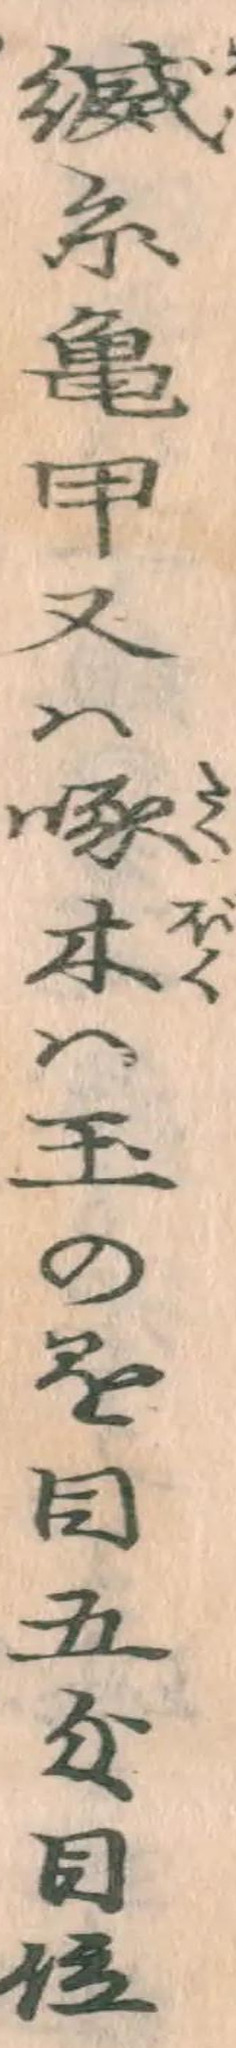一縅糸亀甲又は啄木は玉の懸目五匁目位
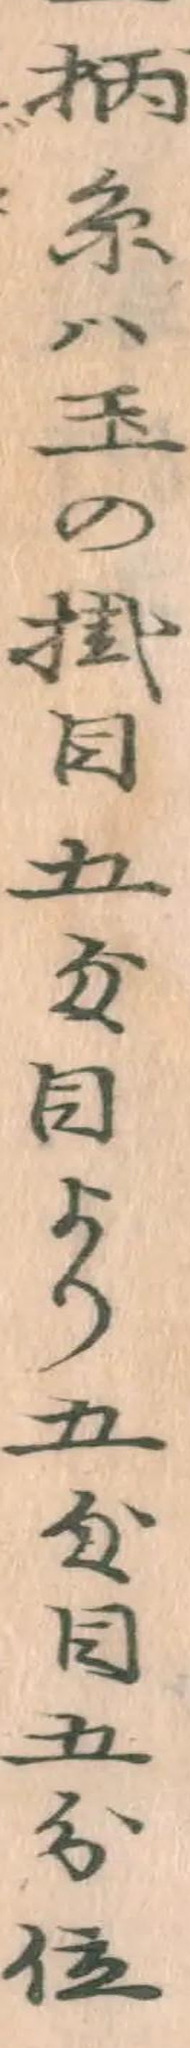一柄糸は玉の掛目五匁目より五匁目五分位
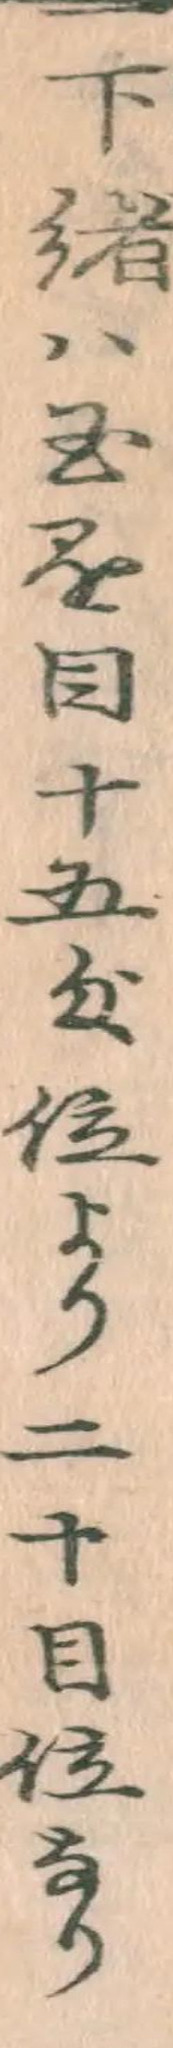一下緒は玉懸目十五匁位より二十目位なり
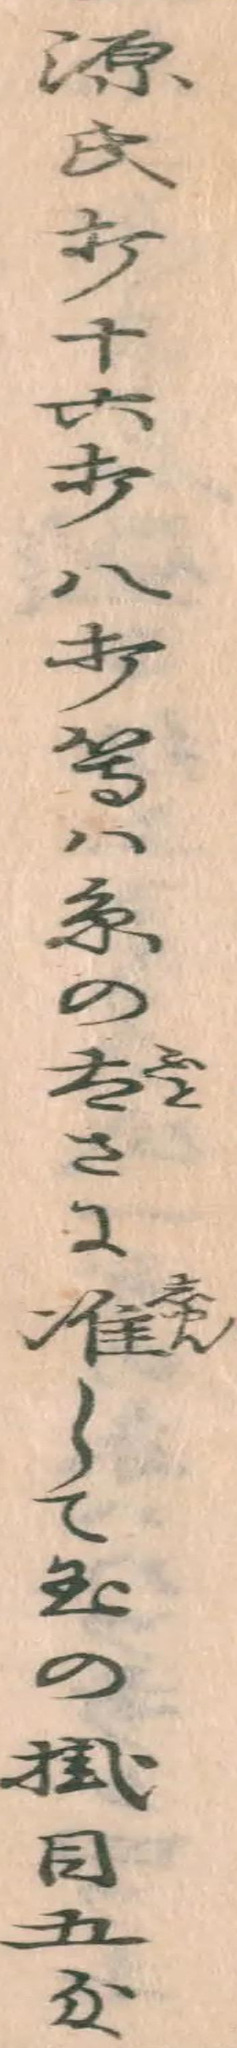一源氏打十六打八打等は糸の太さに准して玉の掛目五匁
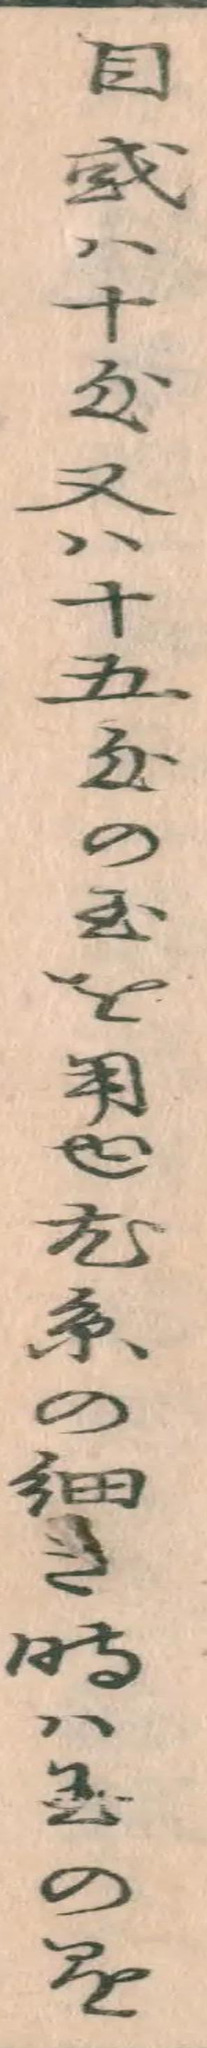目或は十匁又は十五匁の玉を用ゆ尤糸の細き時は玉の懸
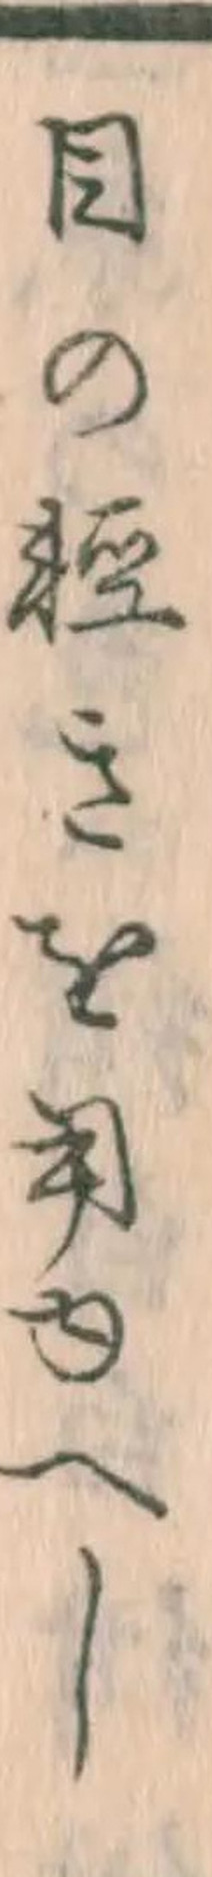目の軽きを用ゆへし
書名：機織彙編 5巻. [2]
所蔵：国立国会図書館 National Diet Library, JAPAN
